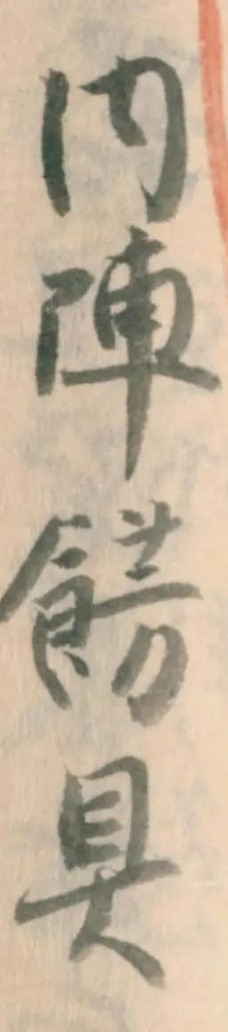内陣餝具

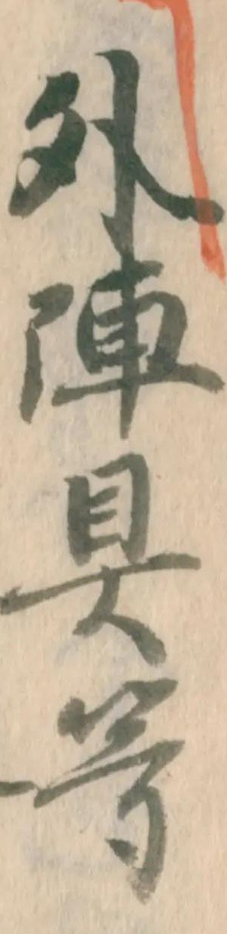外陣具等
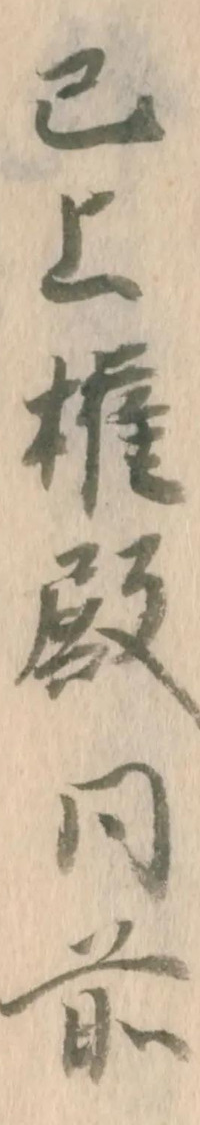已上権殿同前
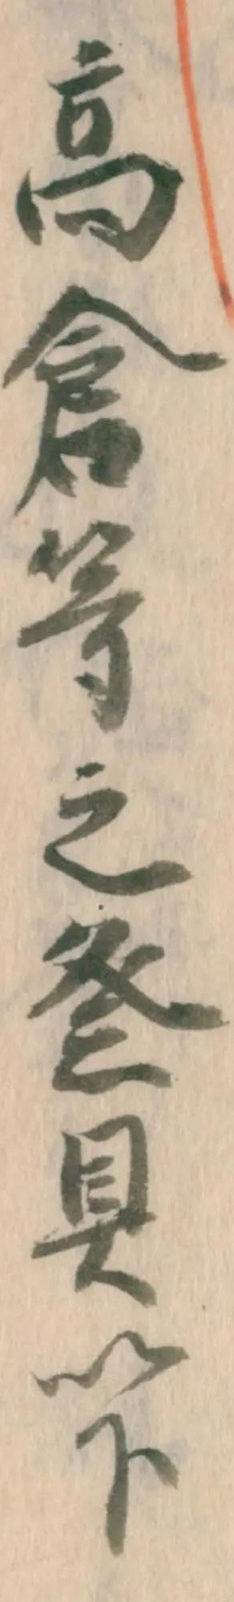高倉等之祭具以下
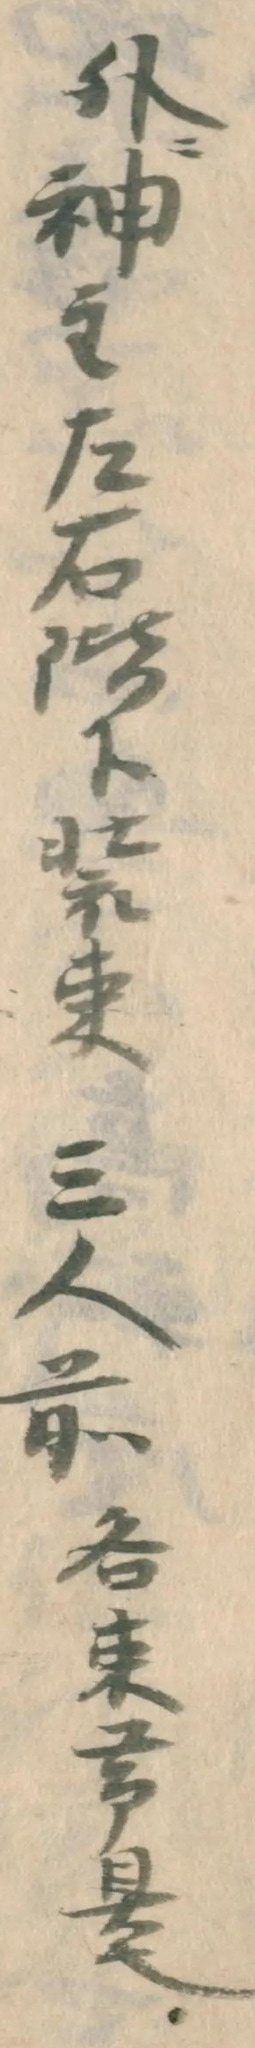外神主左右階下装束三人前各束帯具也

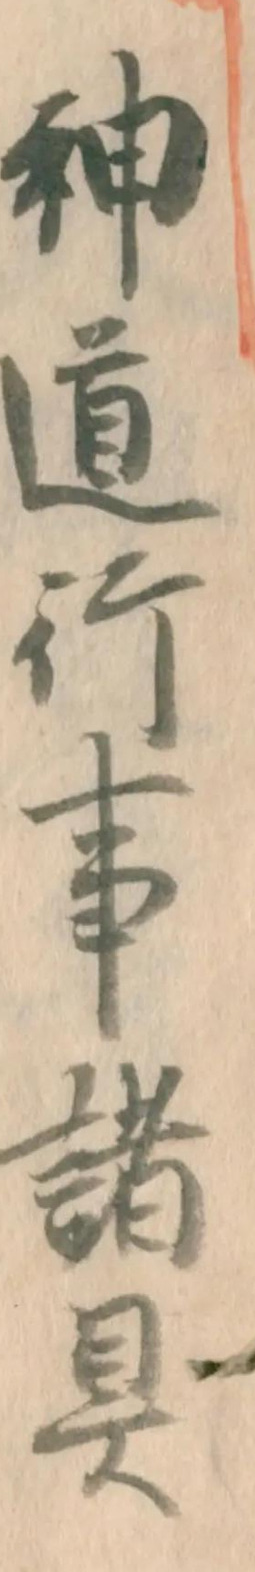神道行事諸具
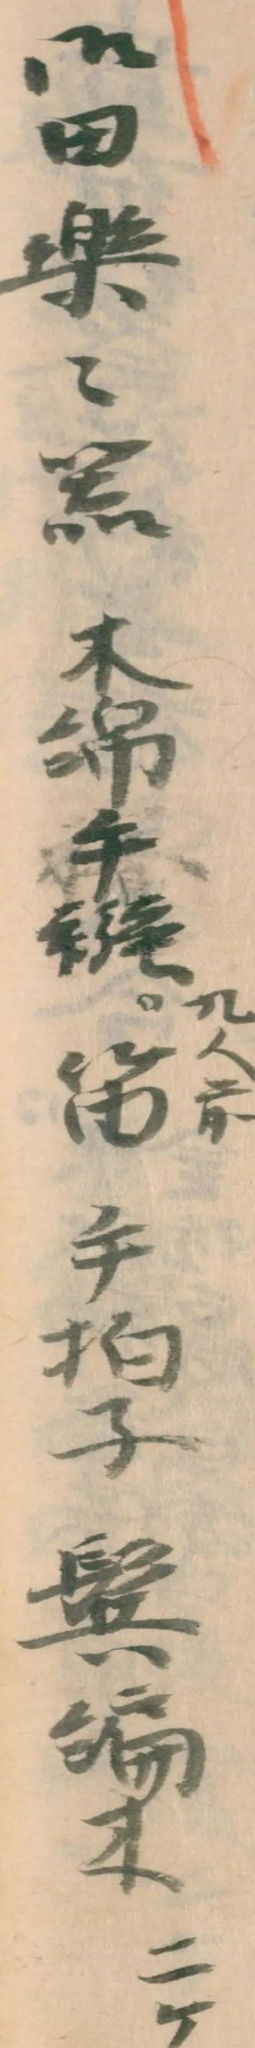御田楽々器木綿手繦◦笛手拍子鬂編木二ヶ
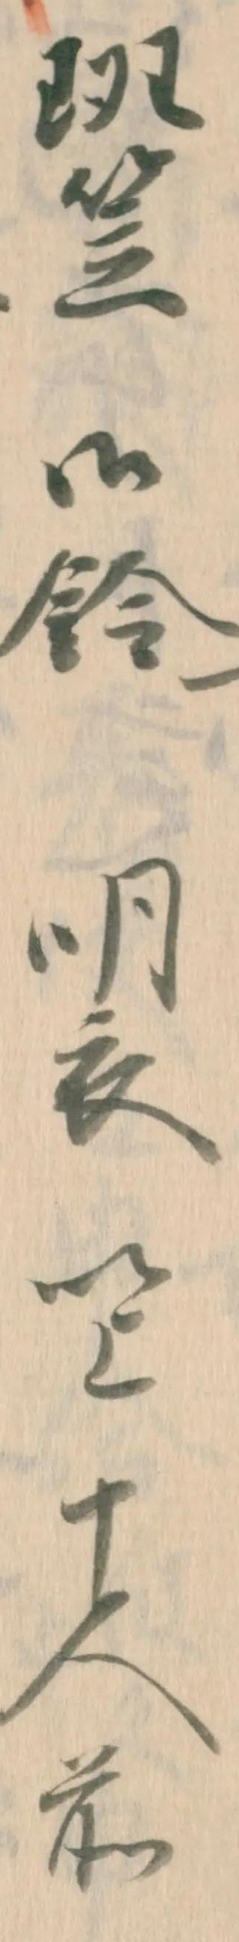斑笠御鈴明衣以上十人前
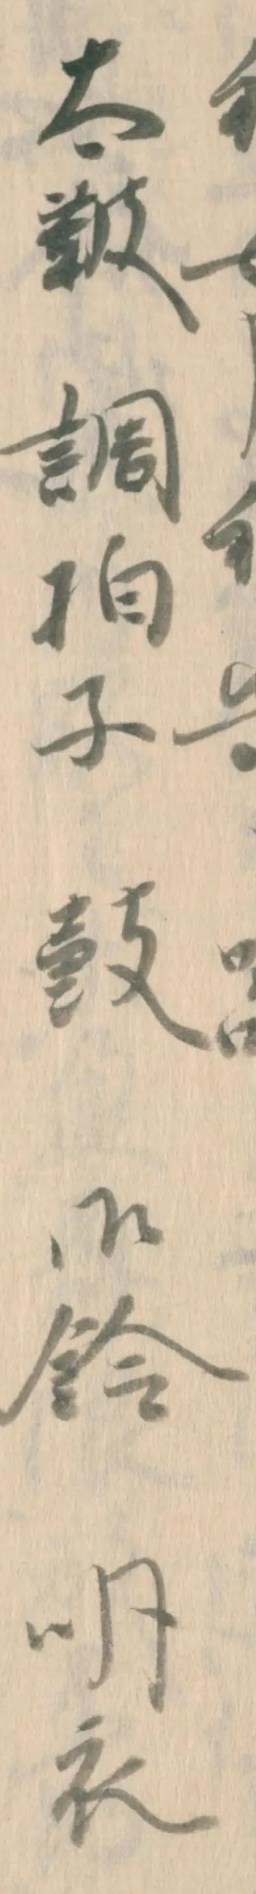太鼓調拍子鼓御鈴明衣
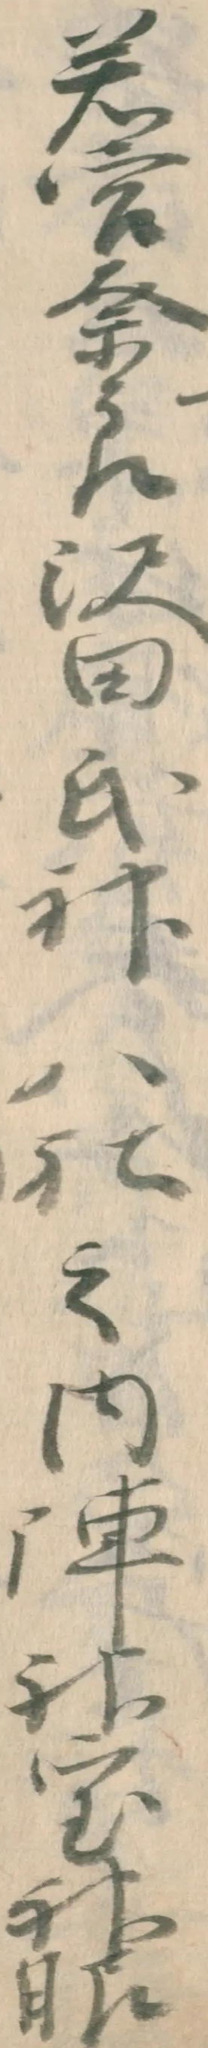若宮奈良沢田氏神八社之内陣神宝神服
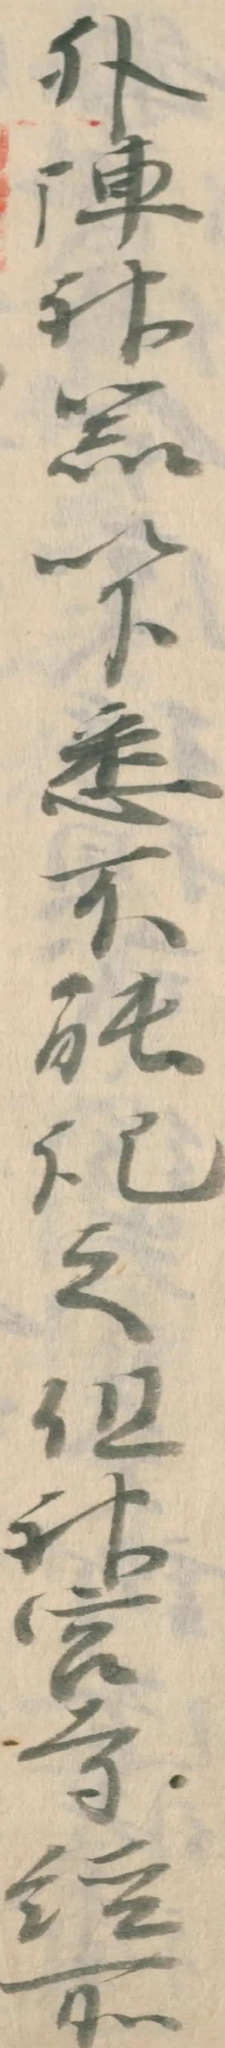外陣神器以下悉不能記之但神宮寺経所
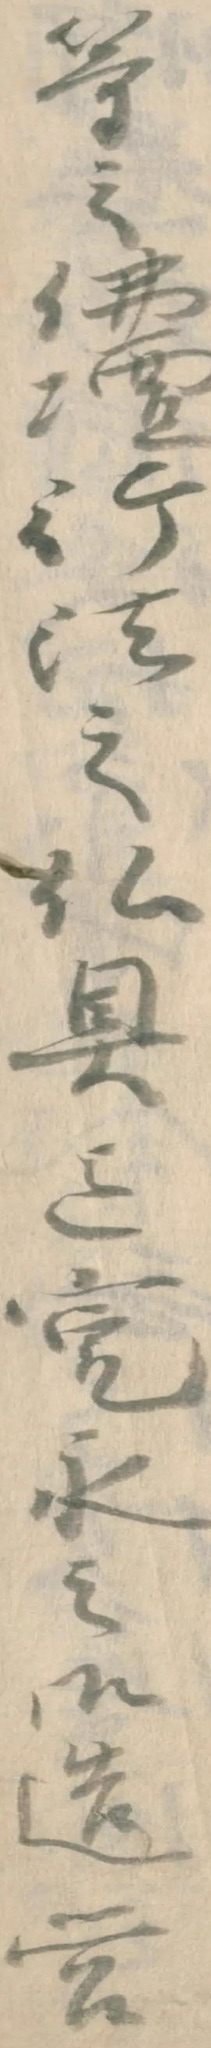等之仏壇行法之仏具迄寛永之御造営

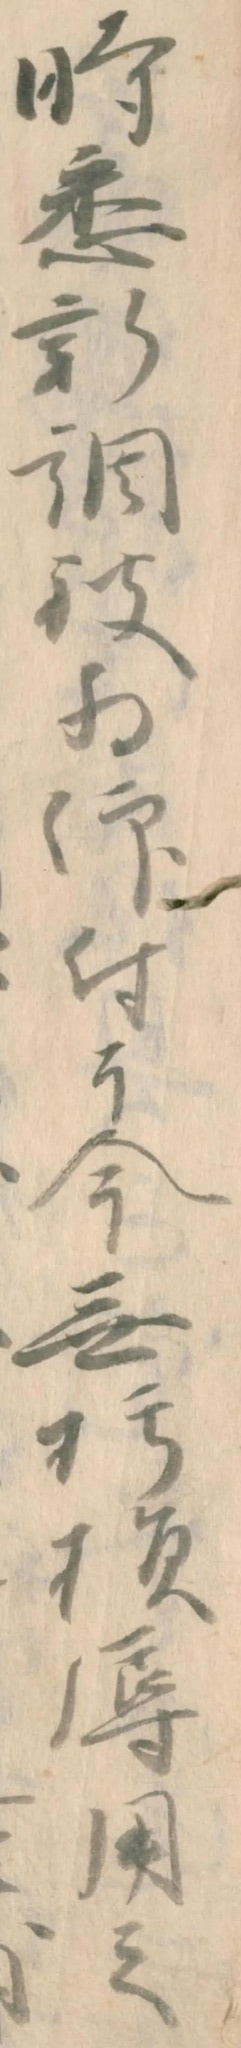時悉新調被為仰付于今無朽損辱用之
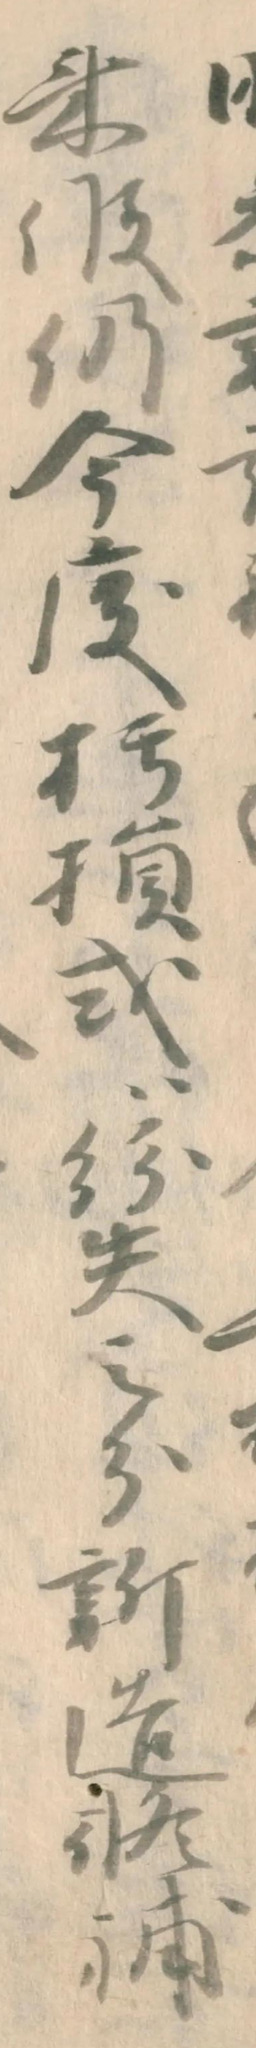来候仍今度朽損或は紛失之分新造修補
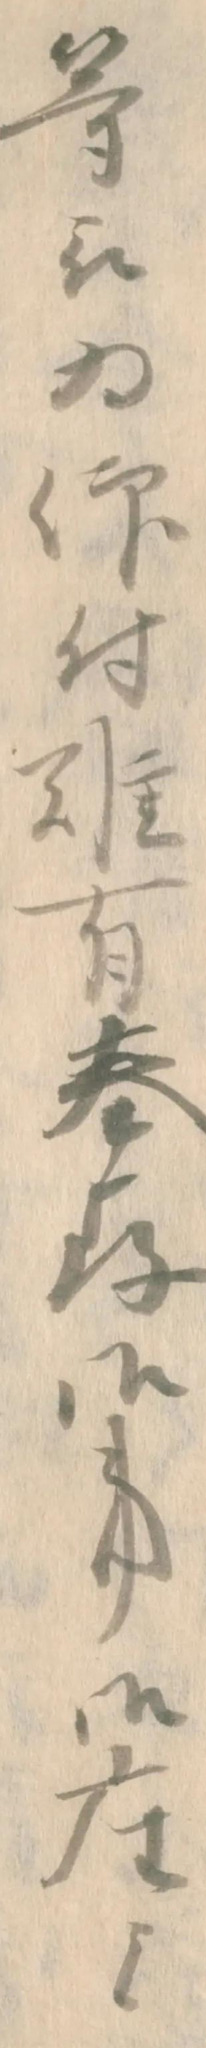等被為仰付難有奉存御事御座候
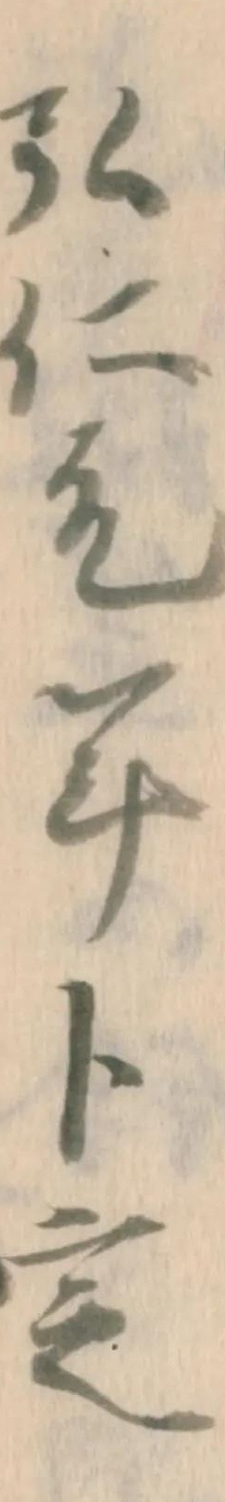弘仁元年卜定
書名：賀茂社記録. 第1冊
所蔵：国立国会図書館 National Diet Library, JAPAN
